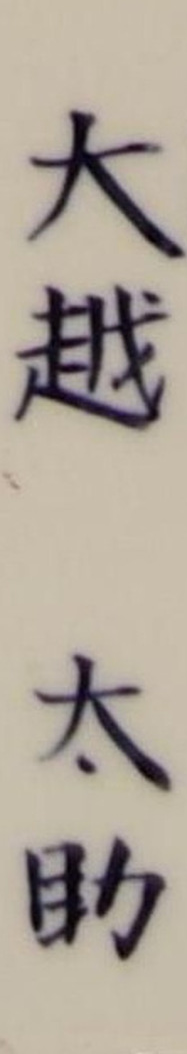大越太助
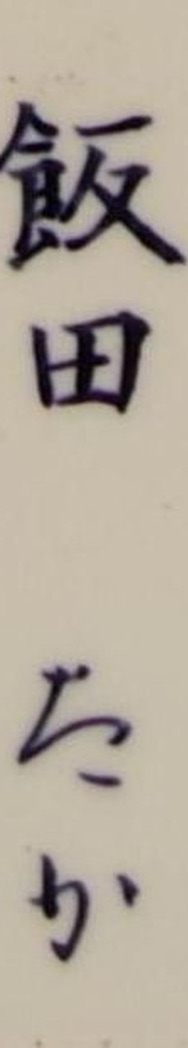飯田たか
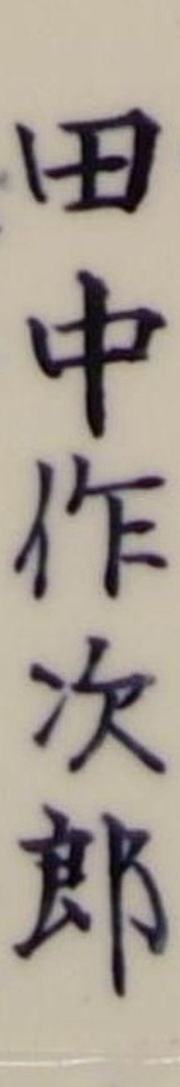田中作次郎
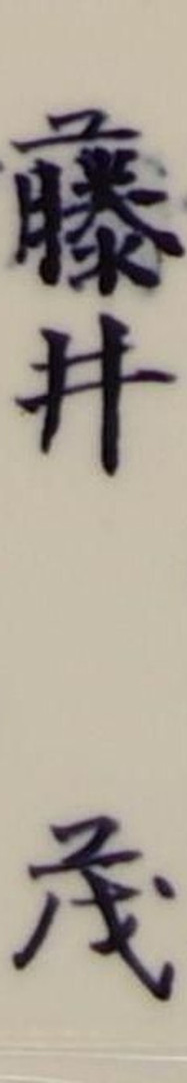藤井茂
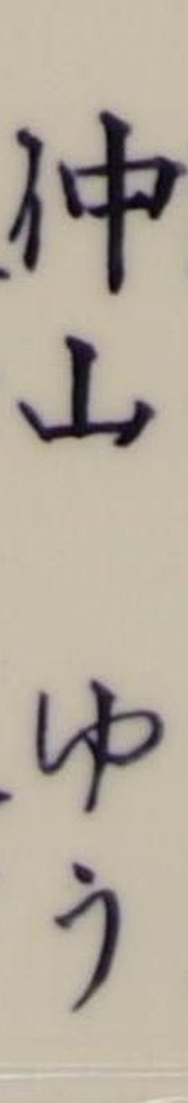仲山ゆう
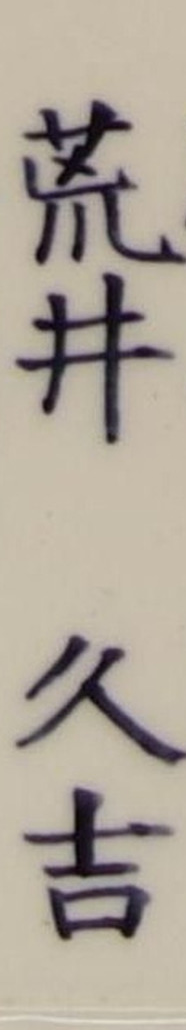荒井久吉
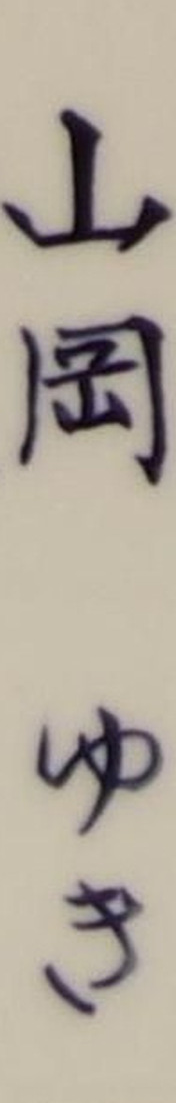山岡ゆき
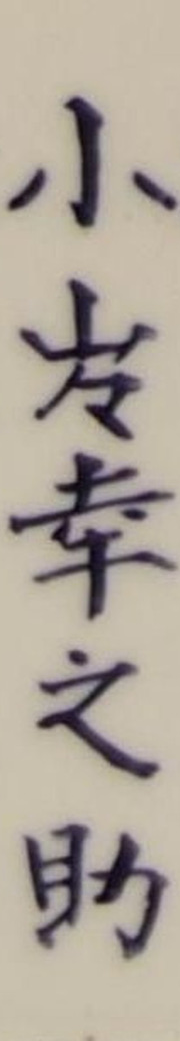小太幸之助
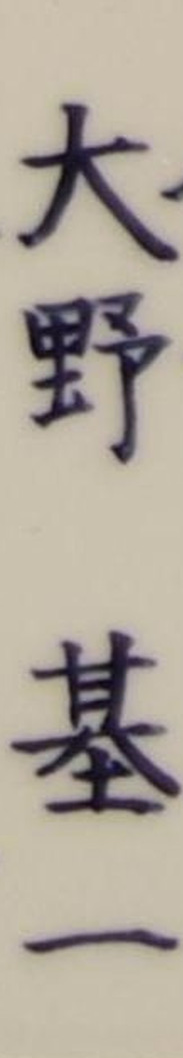大野基一
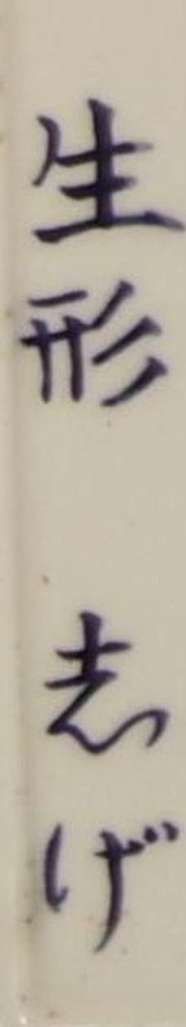生形しげ

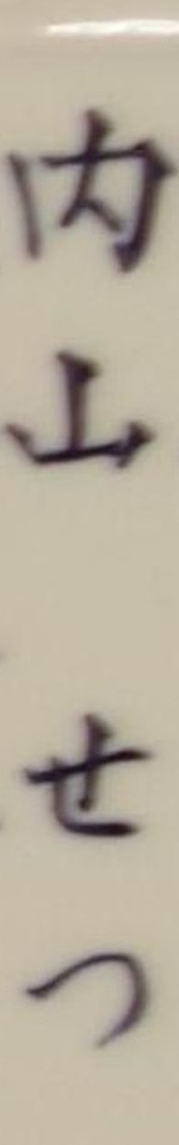内山せつ
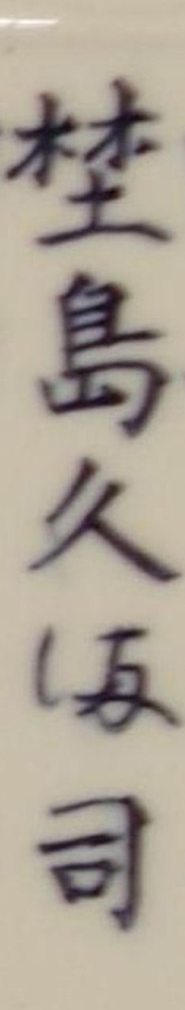埜島久満司
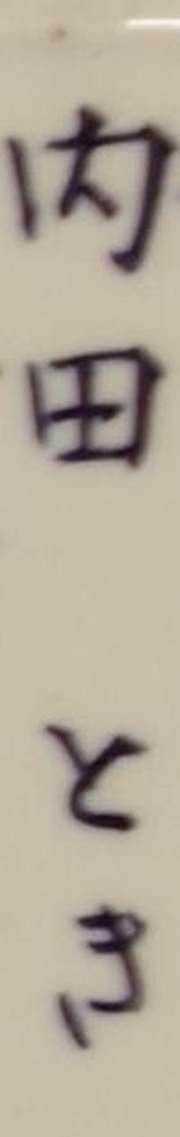内田とき
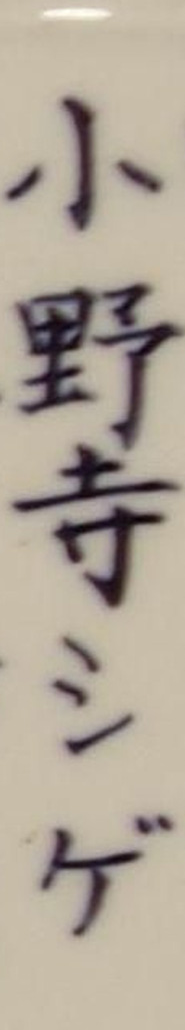小野寺シゲ
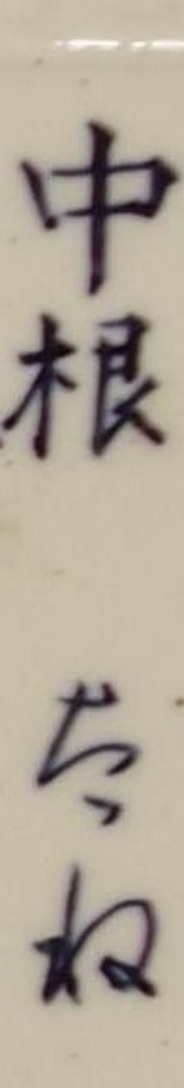中根太ね
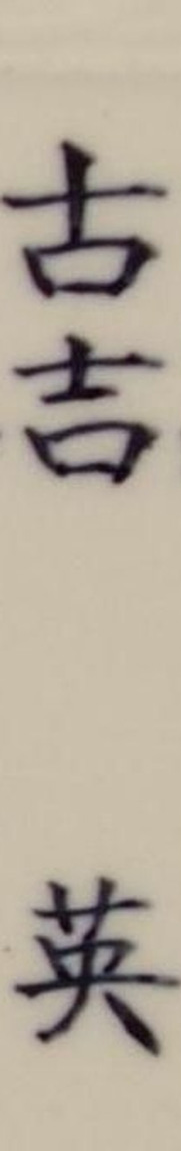古吉英
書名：E~L
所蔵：高野山金剛峯寺
